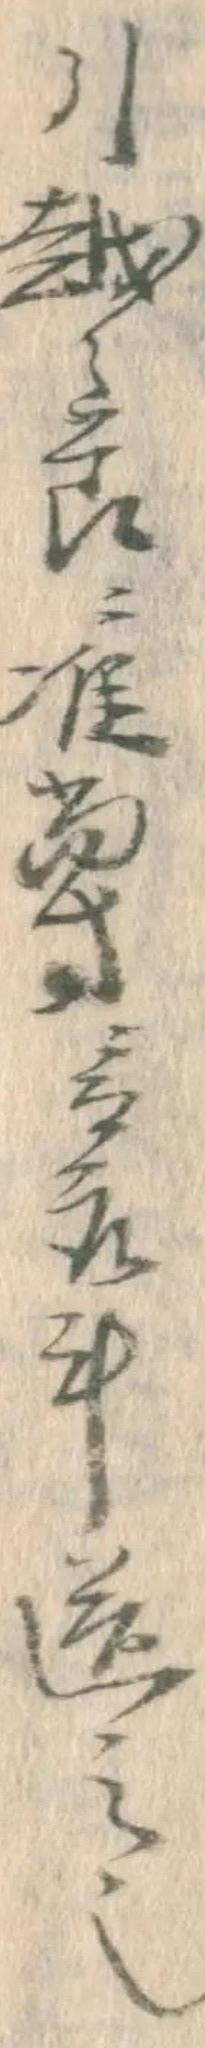引越候節二准當方二而取斗送之也
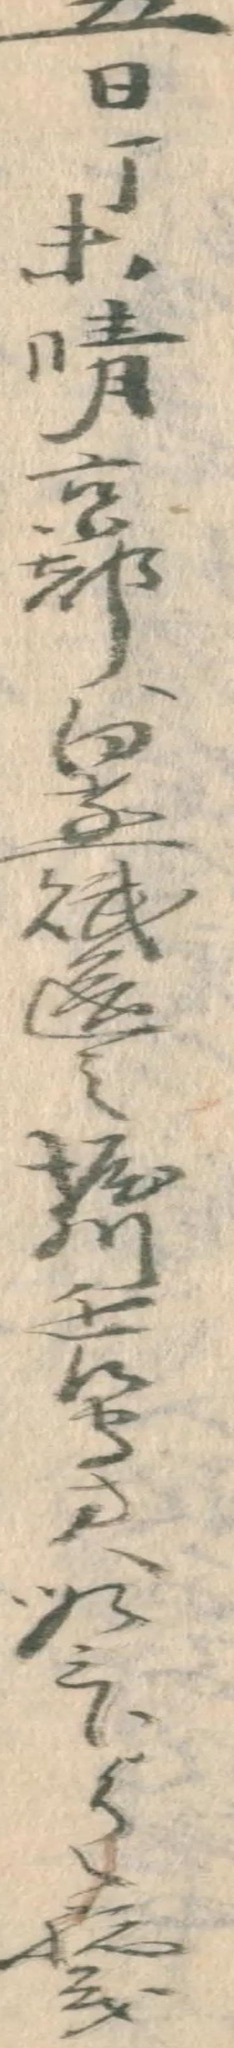五日丁未晴京都へ白支賊送之堀川近江守方へ順三郎より祝義
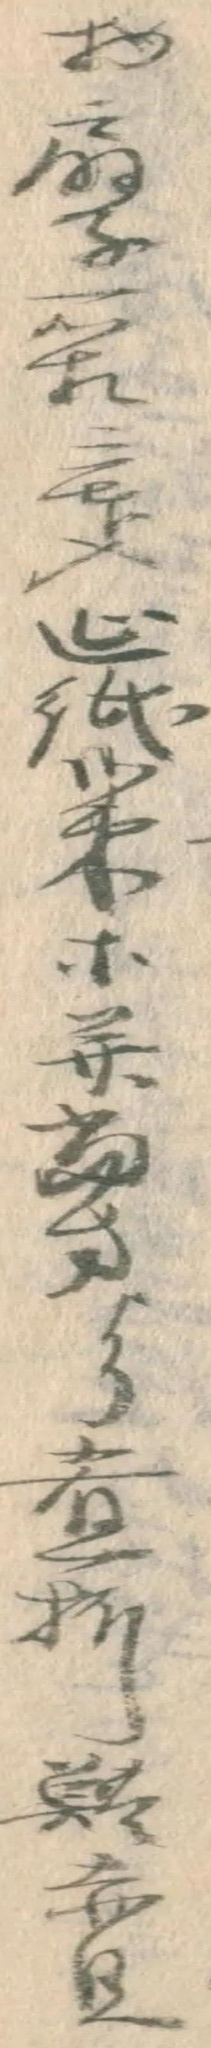物扇子一箱二本入廻紙弐束等并當方より肴一折鮨赤貝
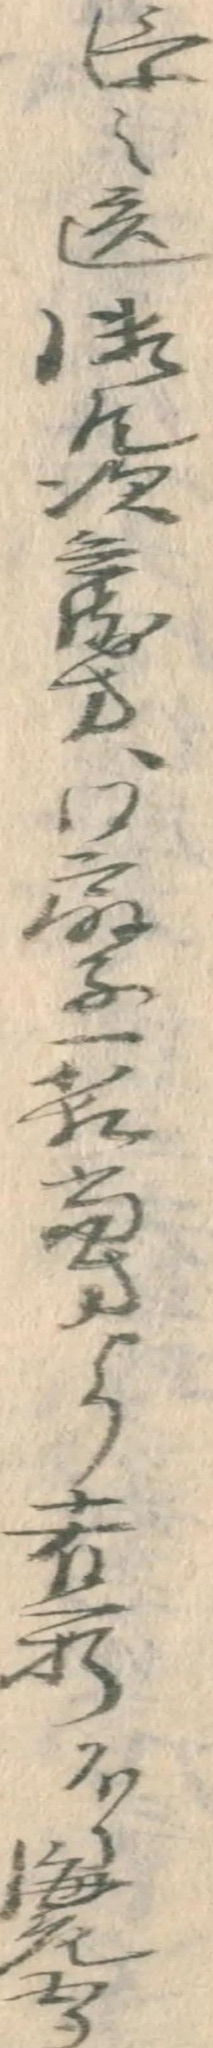添之送御凡次兵衛方へ同扇子一箱當方より肴一折ほり海老五手
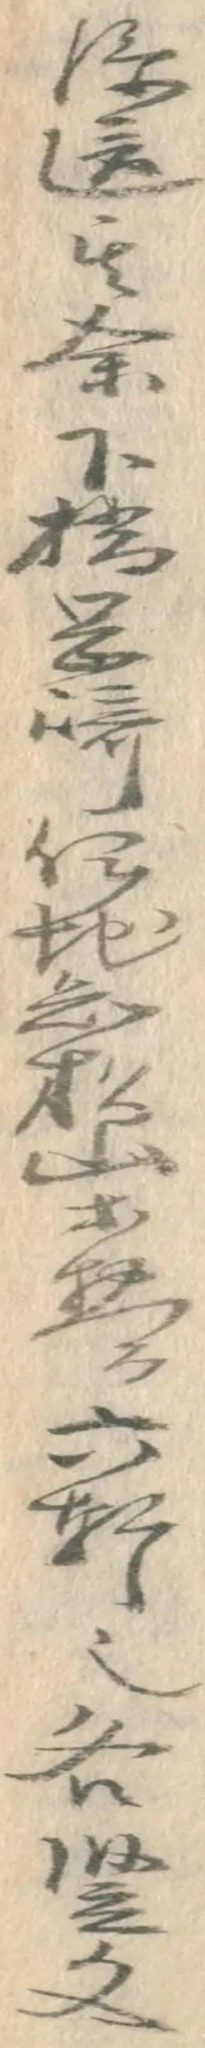添送其余下橋岡崎伊地知松山等惣而六軒也各竪文

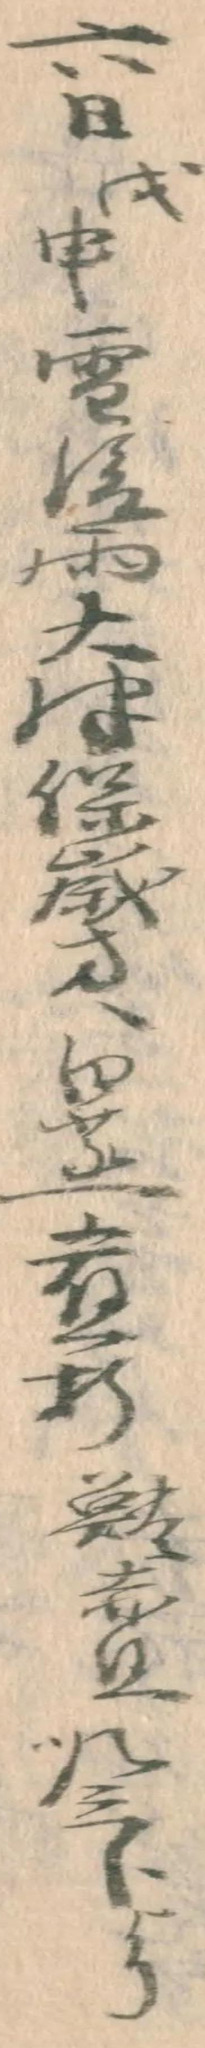六日戊申雪後雨大津保歳方へ白一肴折鮭赤貝二行目順三郎より
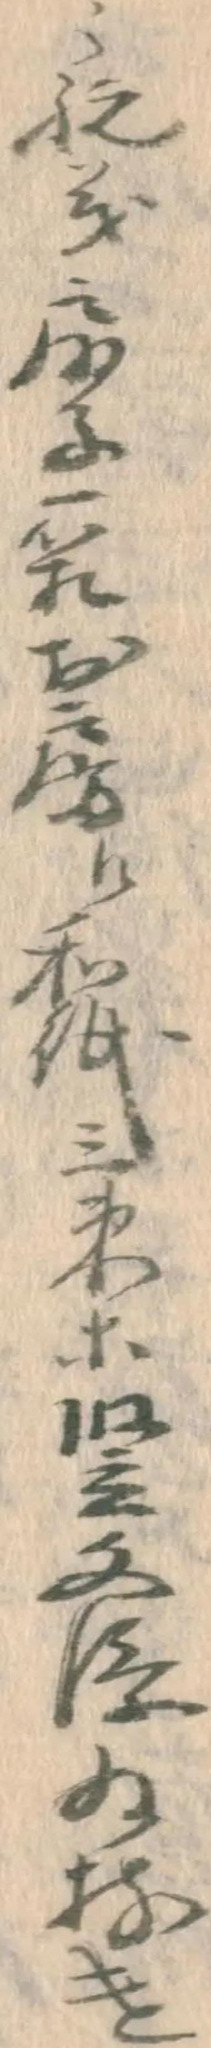被祝義扇子一箱於房え和紙三束等竪文添為持遣
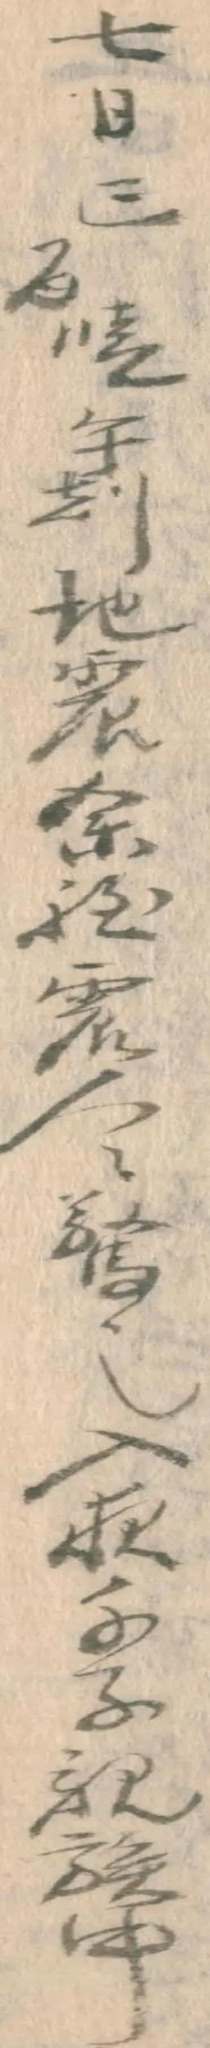七日巳酉晴午刻地震余程震人々驚也入夜千子親族中
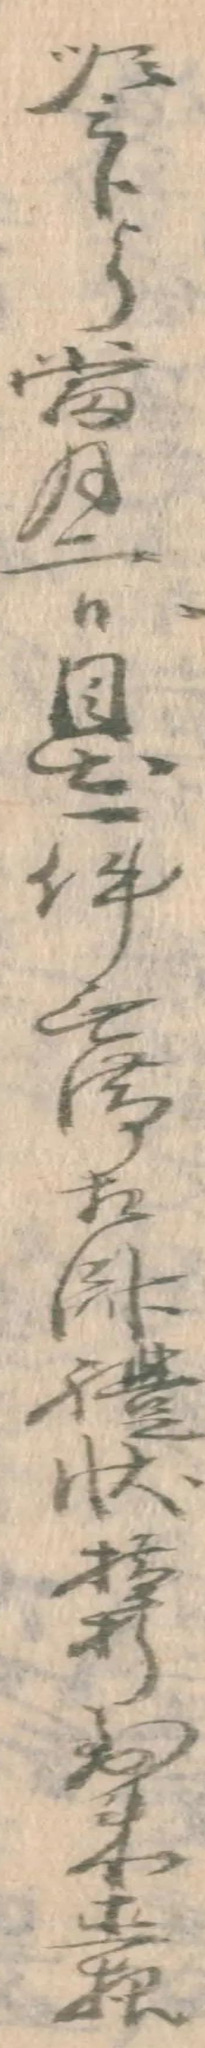順三郎より當月二日目出一件無滞相済禮状指折到来直様
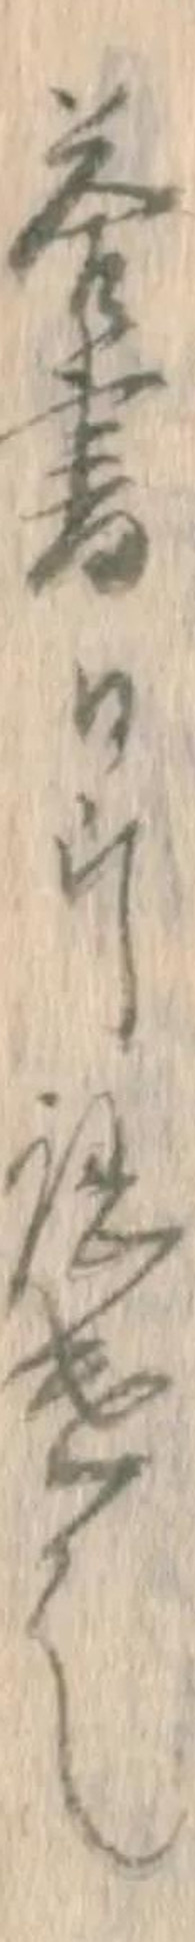答書同断認遣也
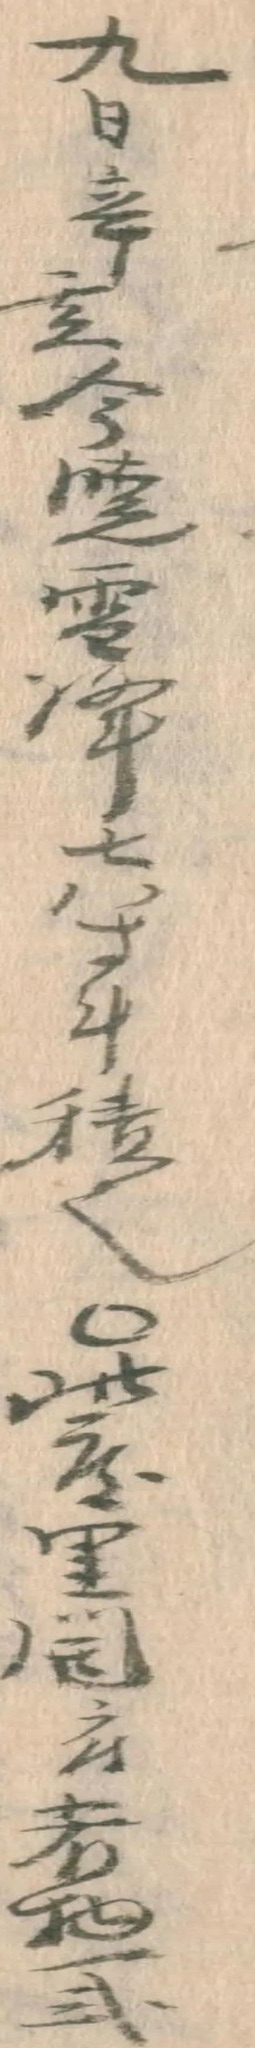九日辛亥今暁雪降七八寸斗積也○此度里開ニ付看物一式
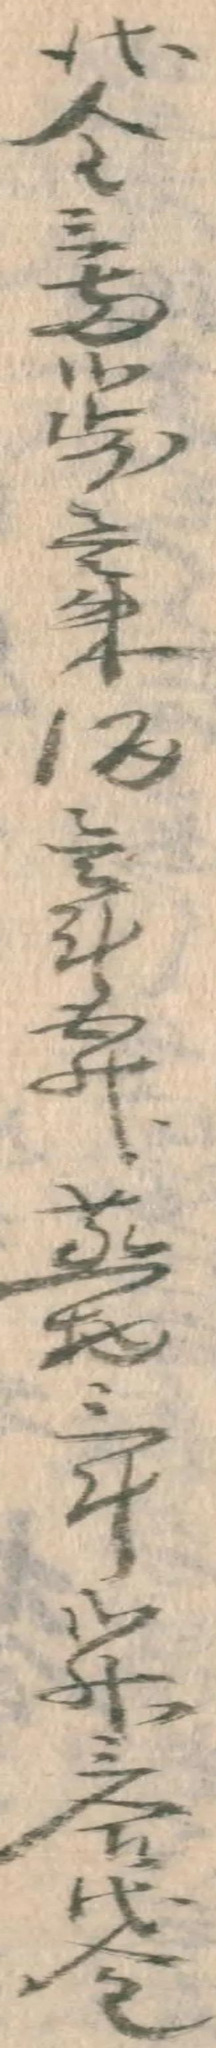代金三両弐歩壱朱酒壱斗五升蒸物三斗弐升三合代金
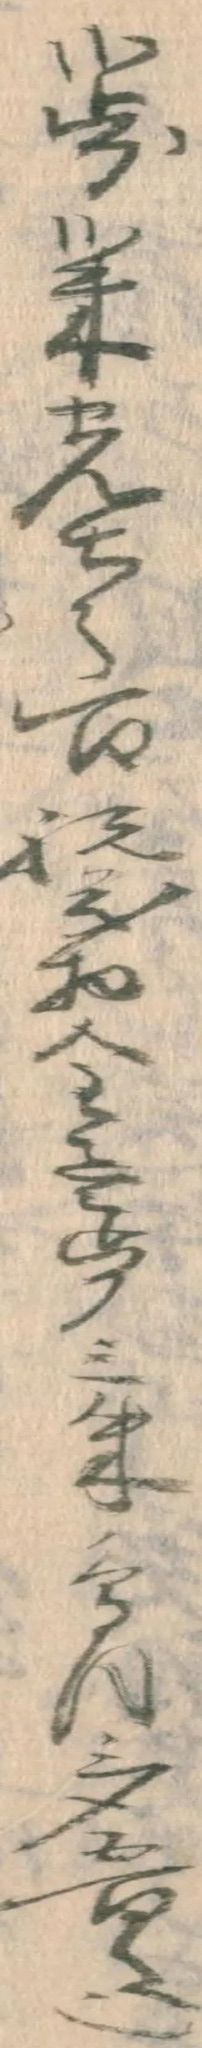弐歩弐朱先出之百祝義物金壱歩三朱鳥目三〆五百文也
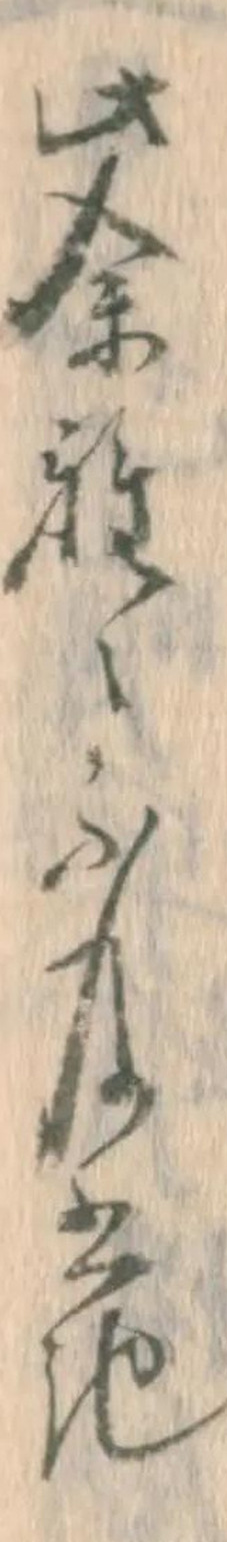此余種々不及書記
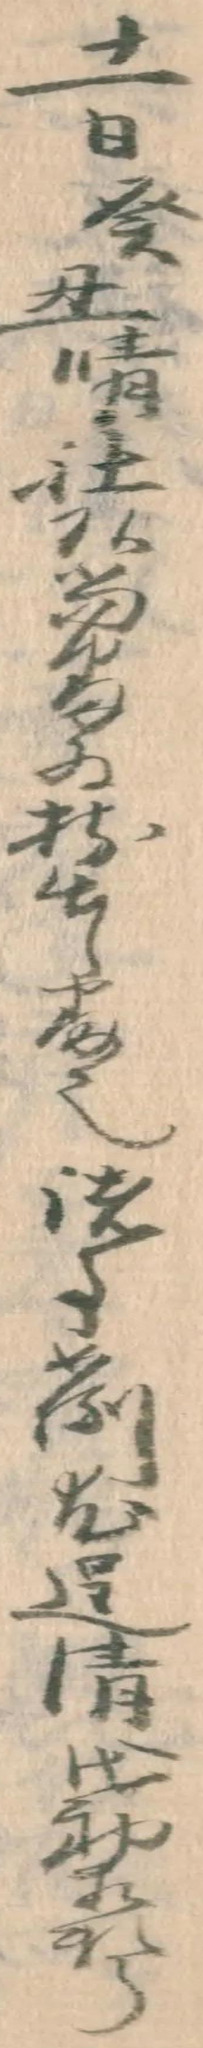十一日癸丑晴社頭当番為持出し番也諸事如例尤是清代勤相願候事
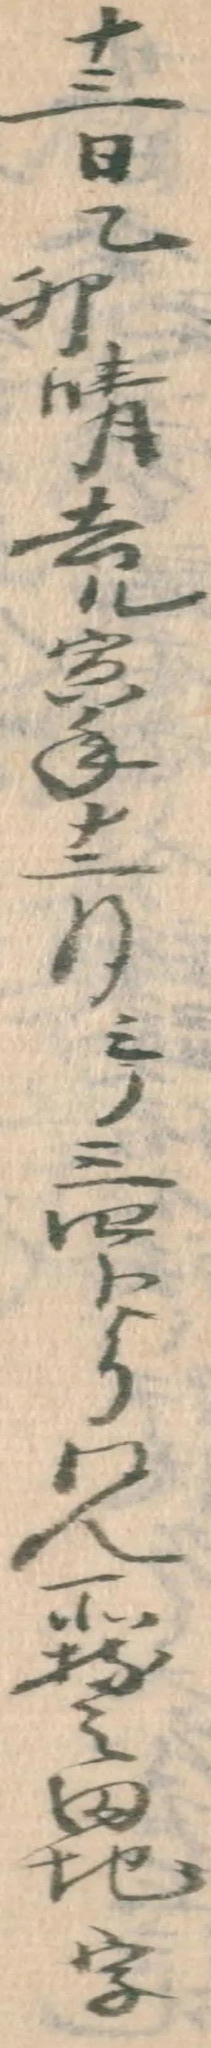十三日乙卯晴去ル寅年十二月三ノ三四郎より同人所持之田地字
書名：賀茂社記録. 第66冊
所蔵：国立国会図書館 National Diet Library, JAPAN
